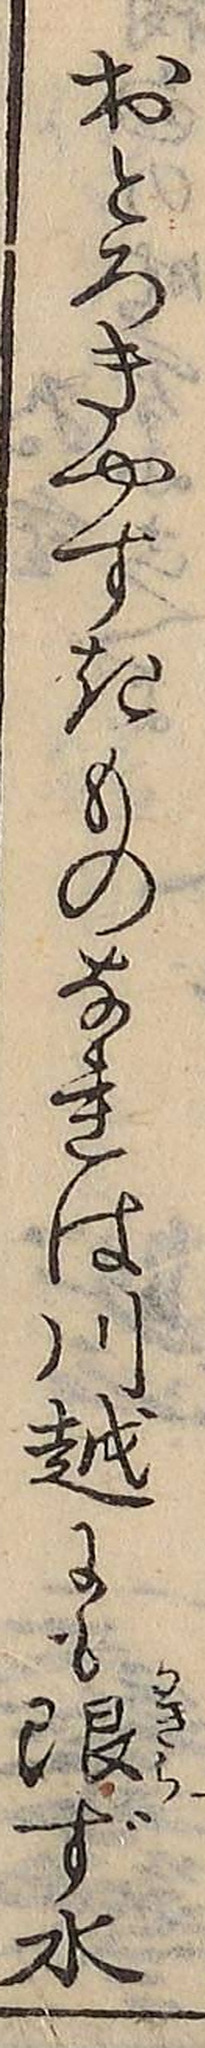おとろきやすきものなれは川越にも限ず水
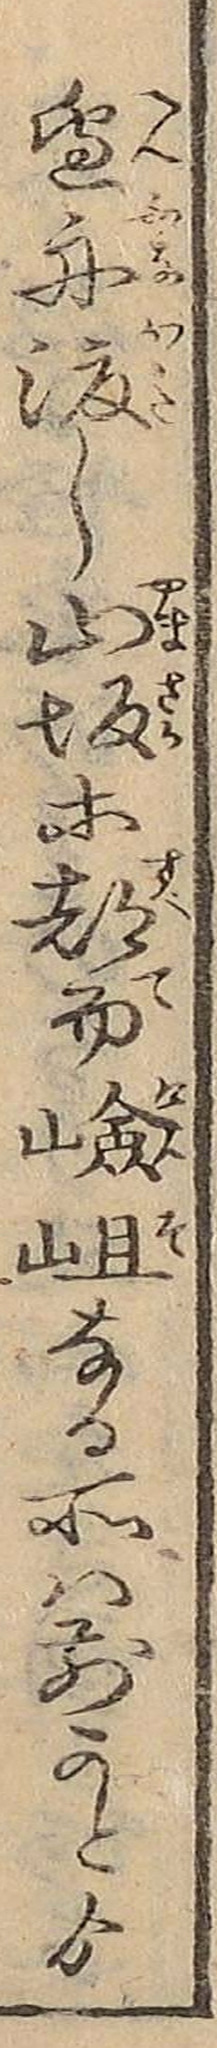辺舟渡し山坂等都而嶮岨なる所は前かとゟ
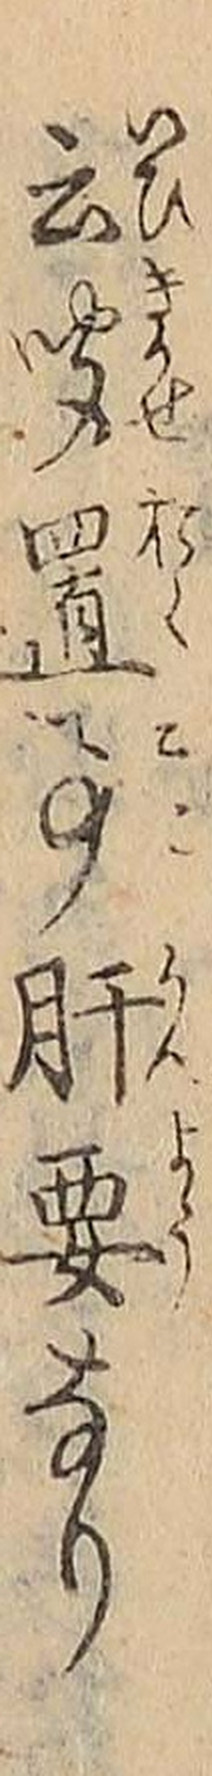云聞置事肝要なり
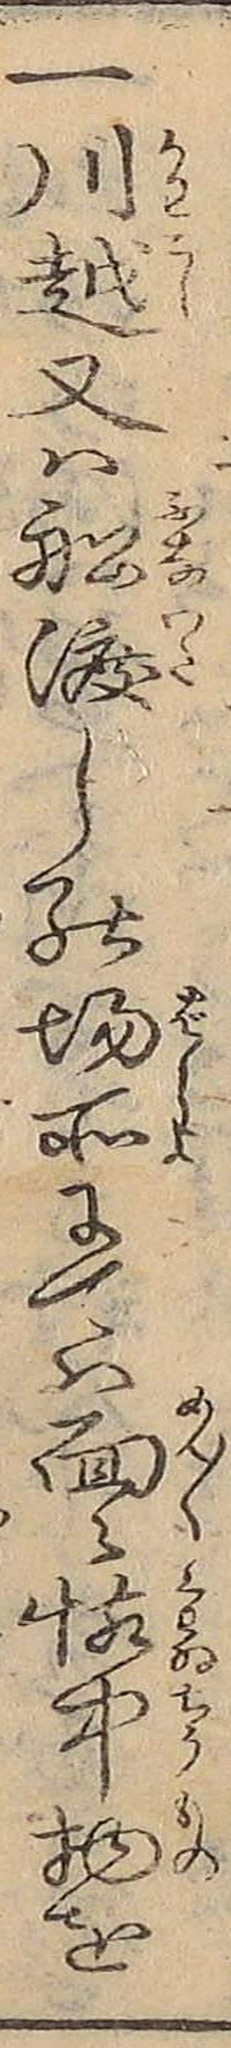一川越又は船渡しの場所にては面々懐中物を
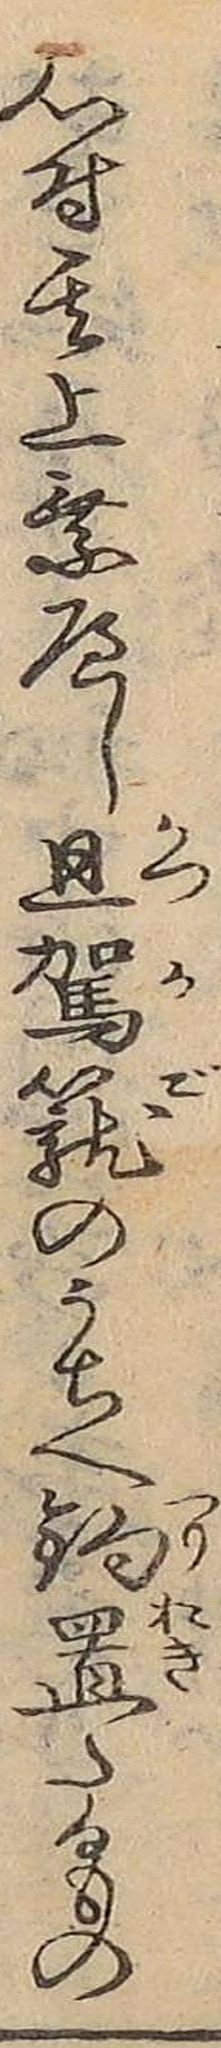心付其上乗へし且駕籠のうちへ釣置たるもの
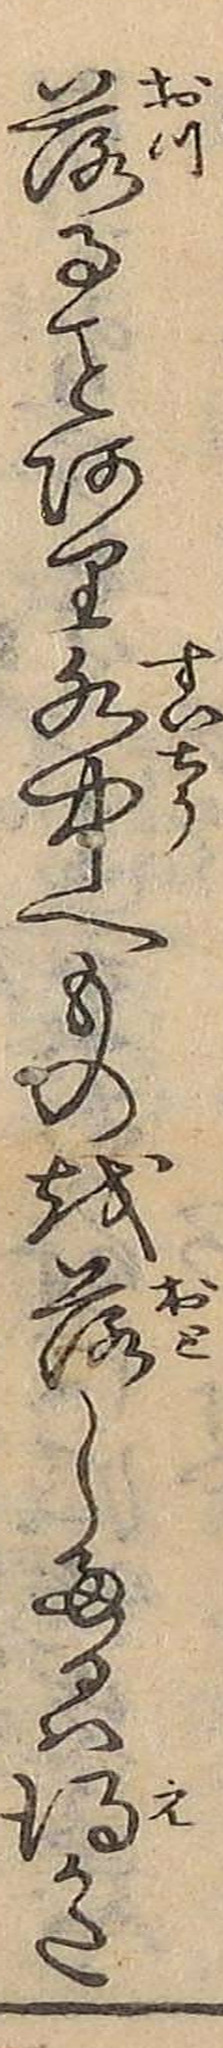落ることあり水中へものを落したるは得かた
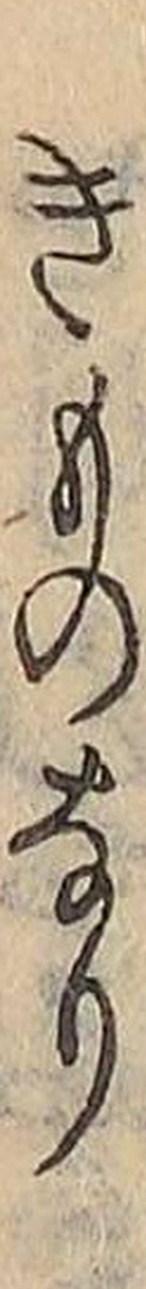きものなり
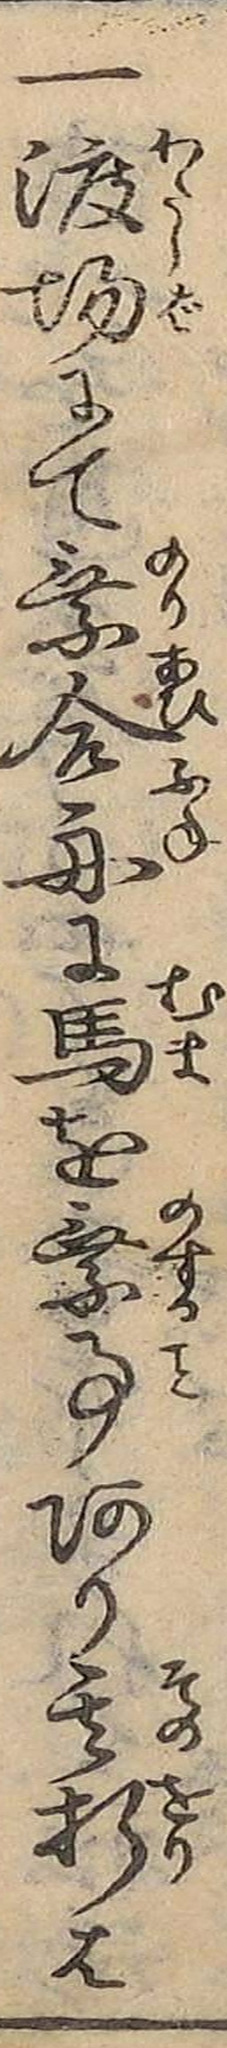一渡場にて乗合舟に馬を乗事あり其折は
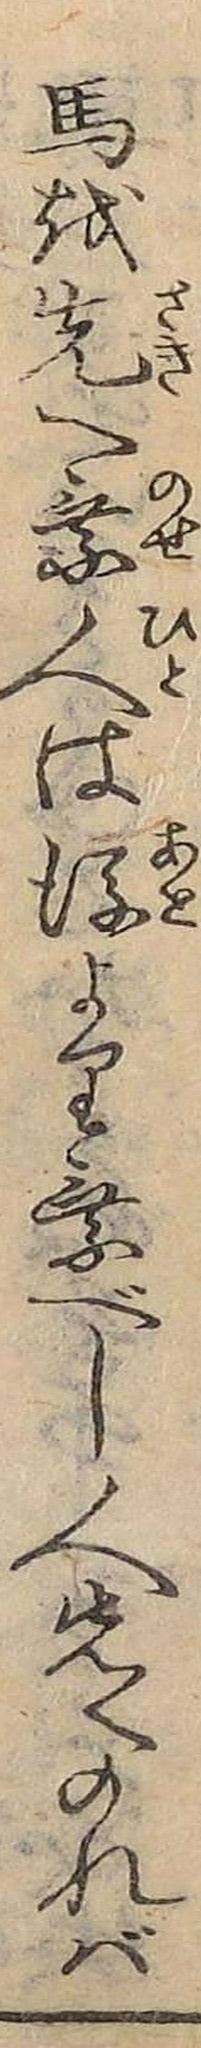馬を先へ乗人は後より乗べし人先くのれば
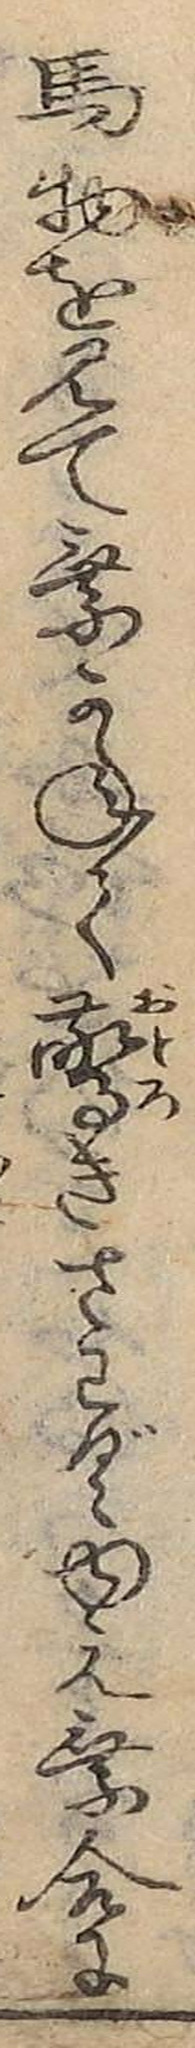馬物を見て乗かねて驚きさわぐゆえ乗合に
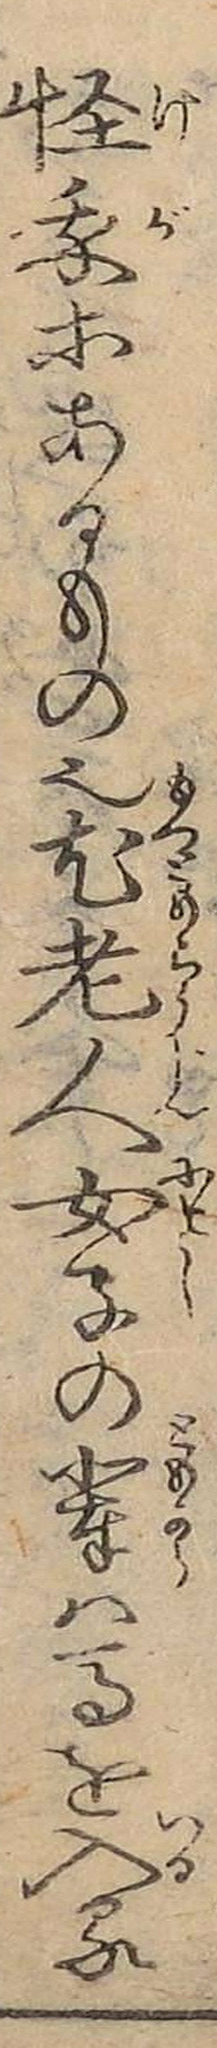怪我等あるもの也尤老人女子の輩は馬を入る

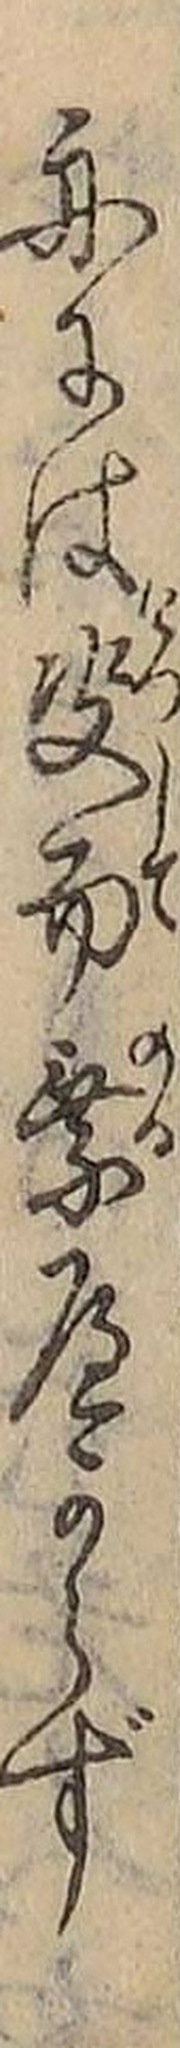舟には決而乗へからず
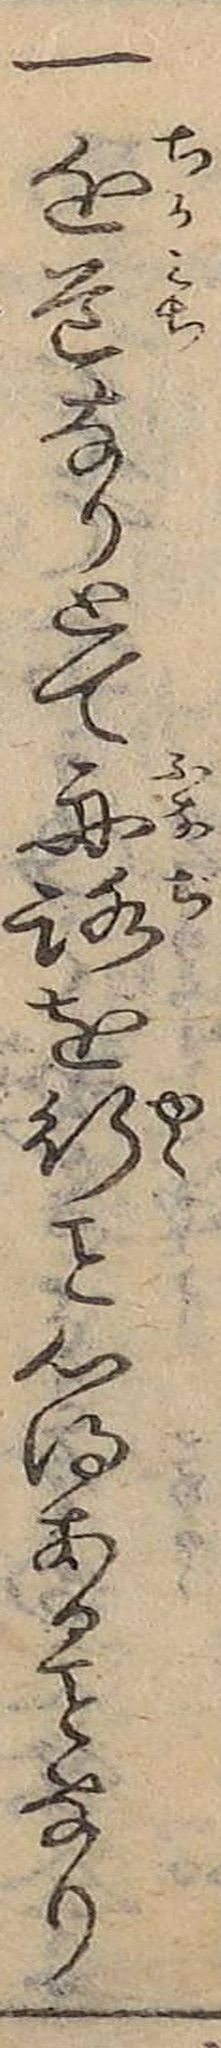一近道なりとて舟路を行こと心得あることなり
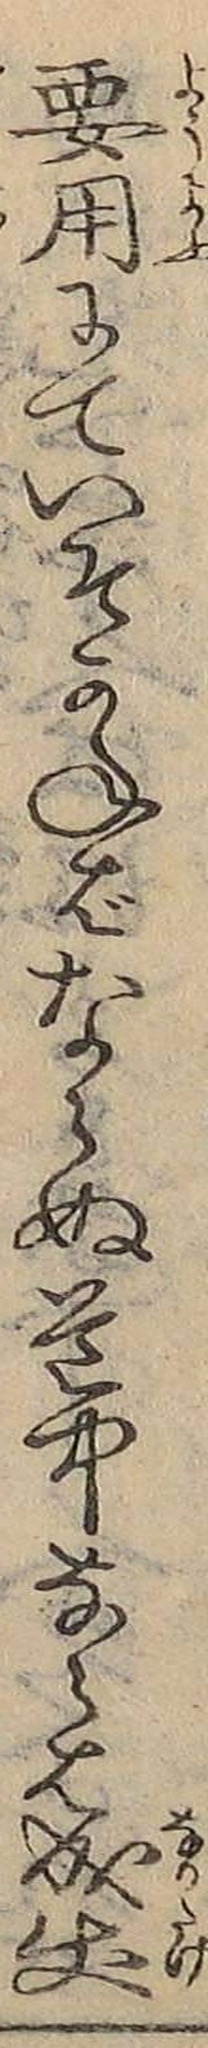要用にていそかねばならぬ道中ならは成丈
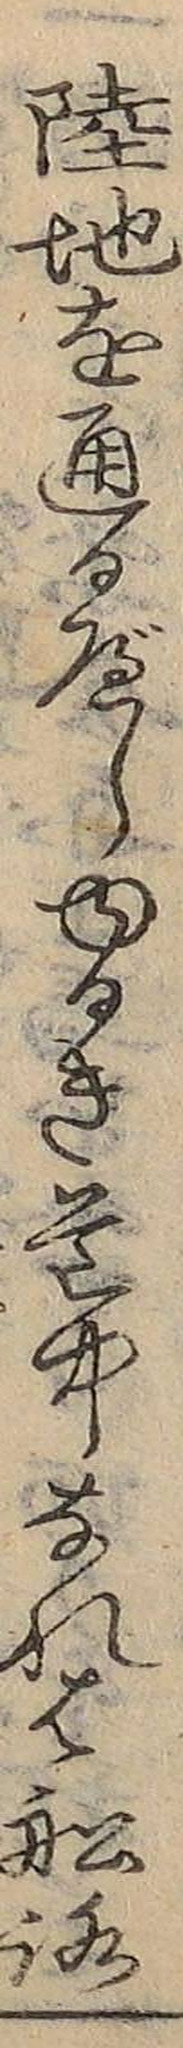陸地を通るべしゆるき道中なれは船路
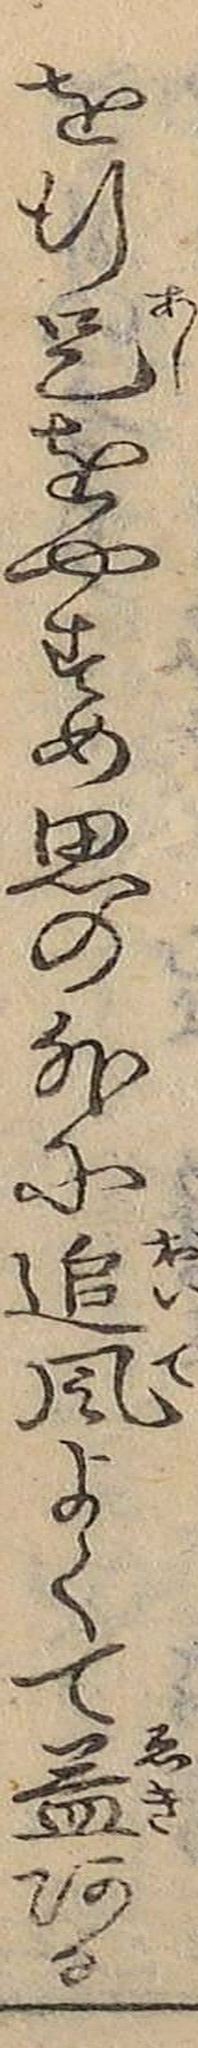を行足をやすめ思の外に追風よくて益ある
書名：旅行用心集
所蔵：神戸大学附属図書館 国文学研究資料館
